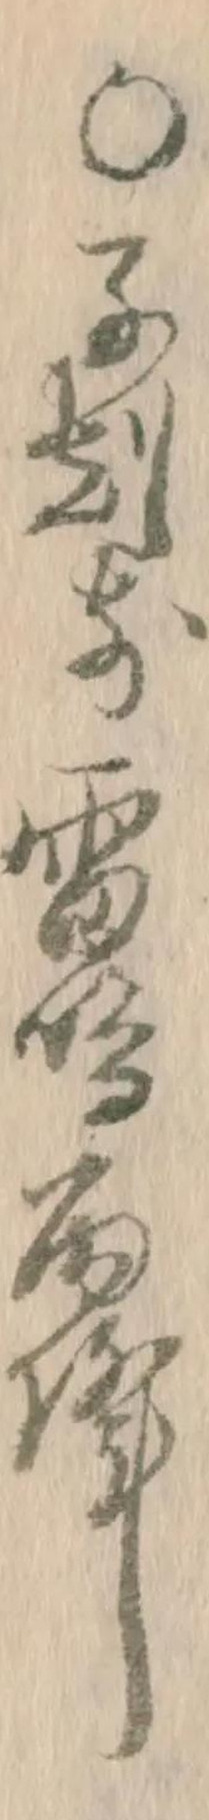○子刻前雷鳴雨降
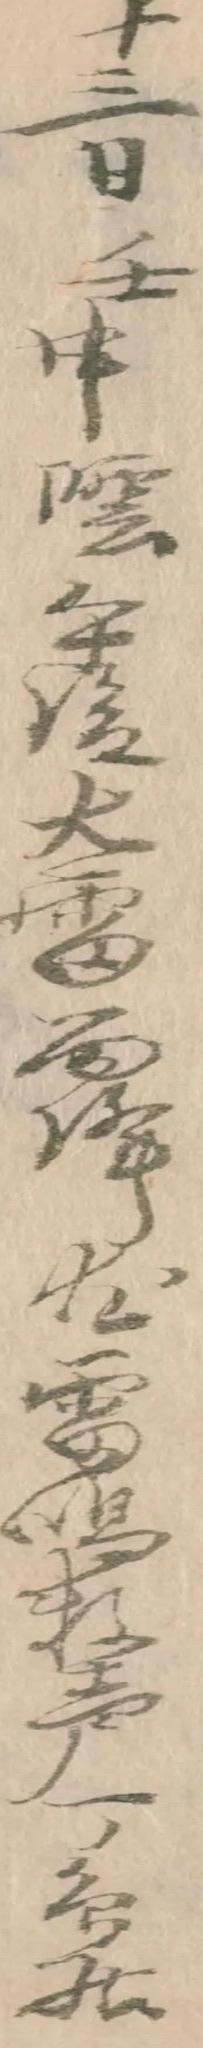十三日壬申曇午後大雷雨降尤雷鳴数声一ノ鳥居
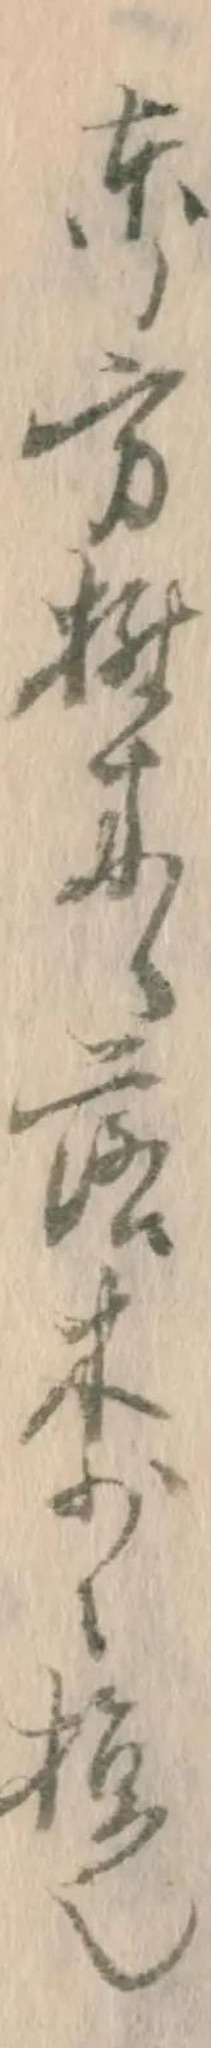東ノ方樹木ヘ落木少々損也
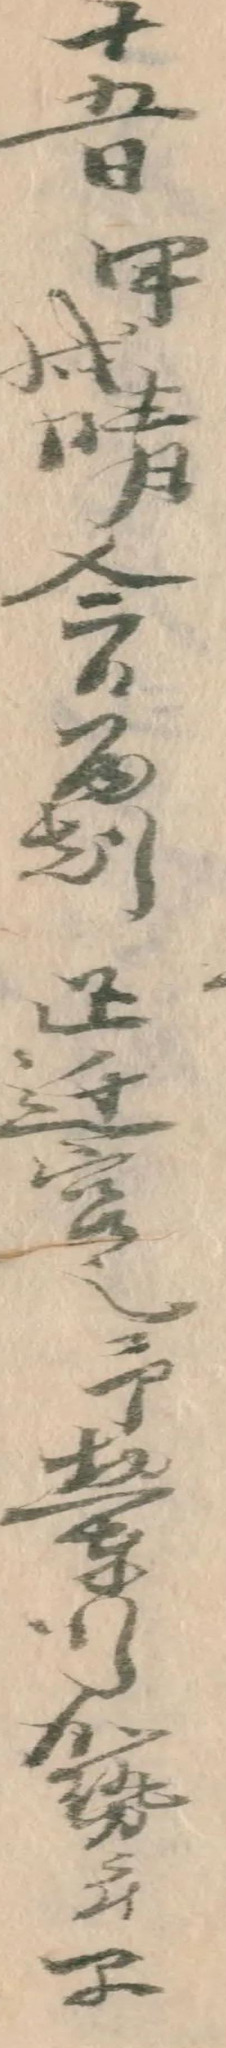十五日甲戌晴今日酉刻正遷宮也予惣奉行加勢ニ付早
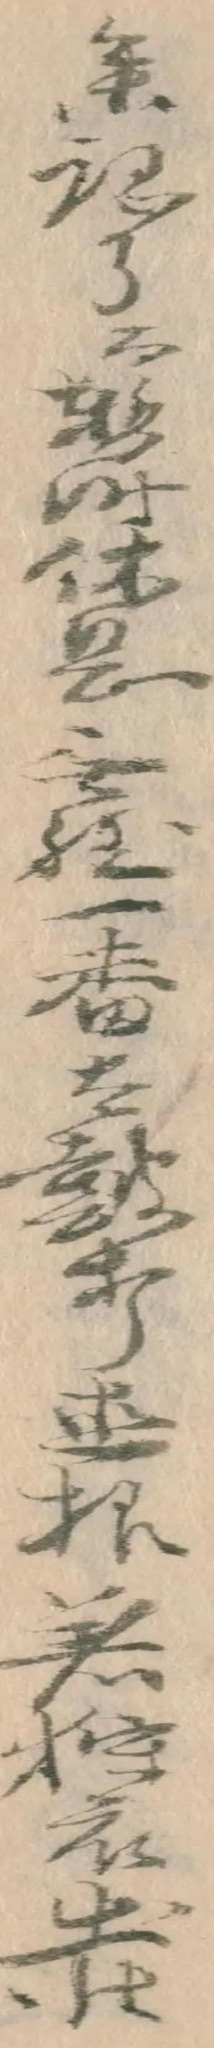参詣了而暫時休息無程一番太皷打直様着狩衣出仕
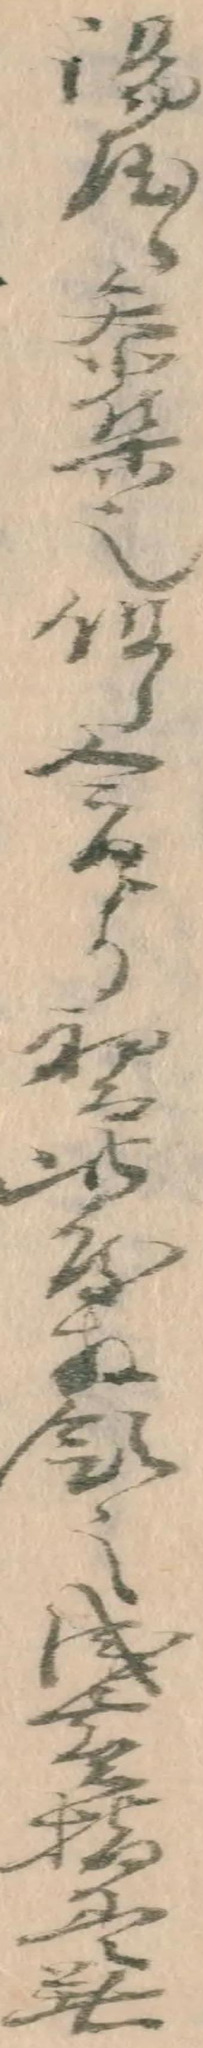湯屋へ参集也但し今日より初而此度拝領之浅黄指貫着
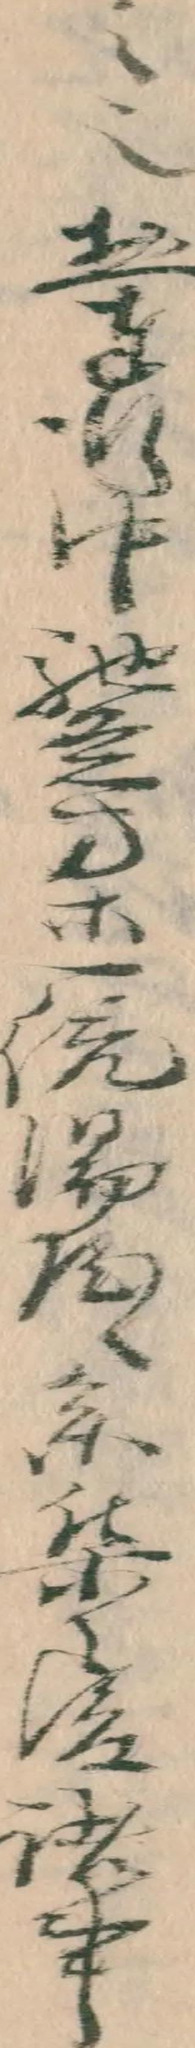之也惣奉行中馳走方等一統湯屋へ参集之後諸事
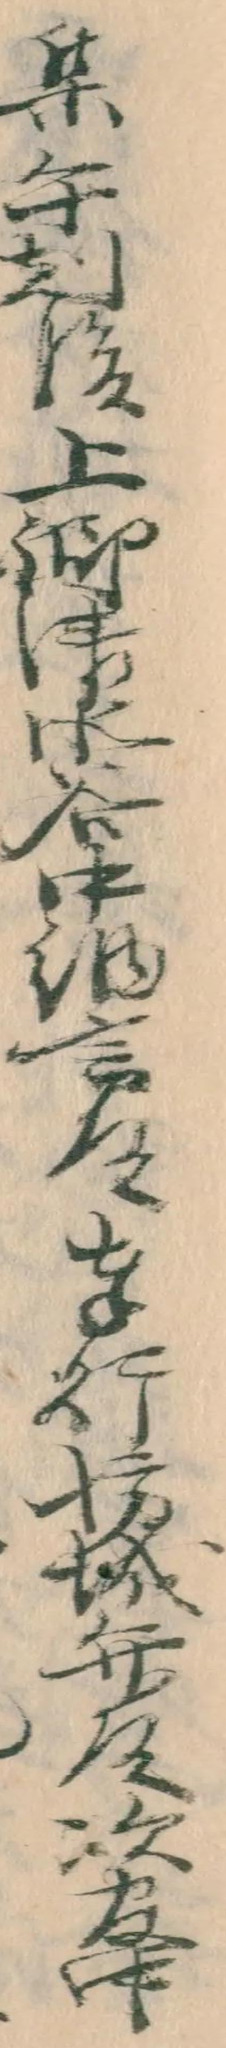集午刻後上卿清水谷中納言殿奉行坊城弁殿次官中
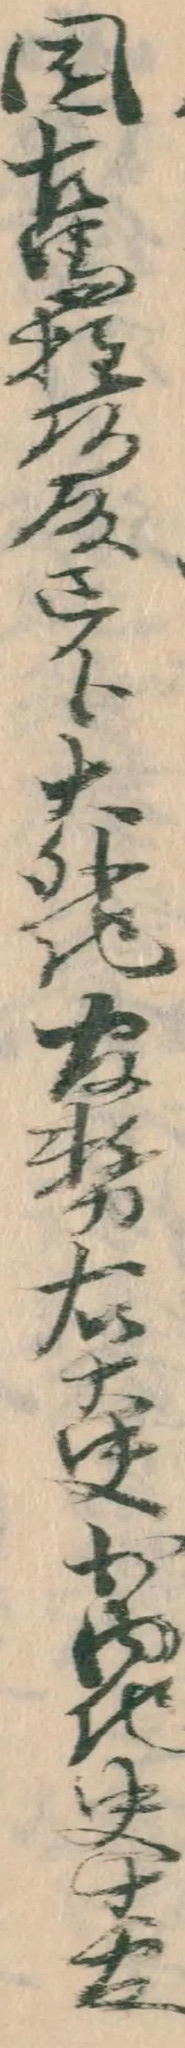因左馬権頭殿已下大外記官務右大夫小内記史生左
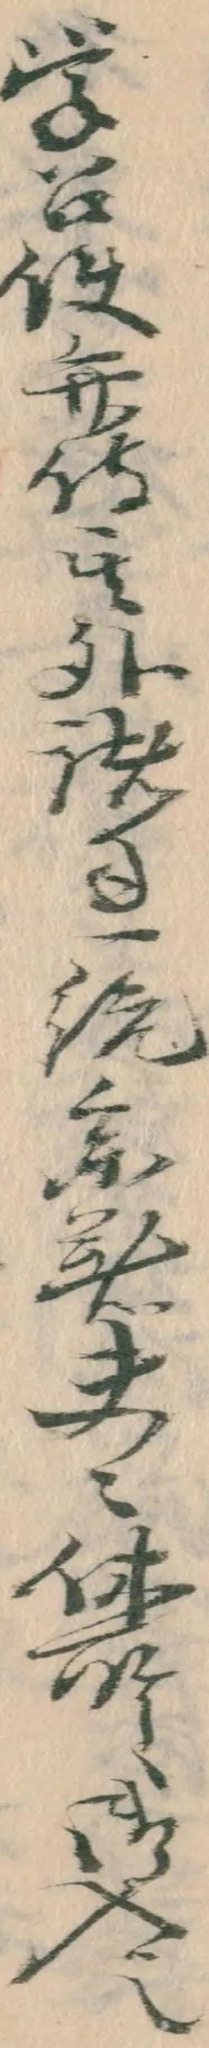掌召使弁侍其外諸司一統参着夫々休所へ御入之
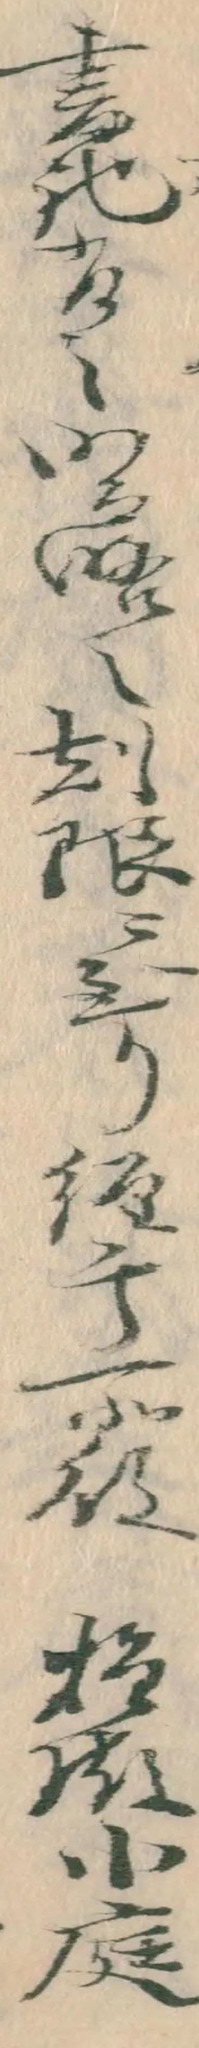書記有之仍而略之刻限ニ至り経千所役権殿小庭
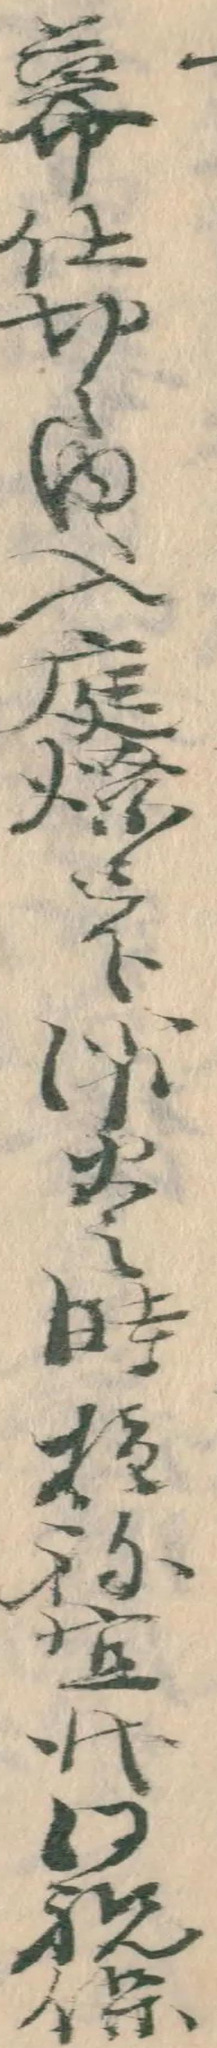幕仕切之内へ入庭燎已下消火之時種権祢宜代同祝保
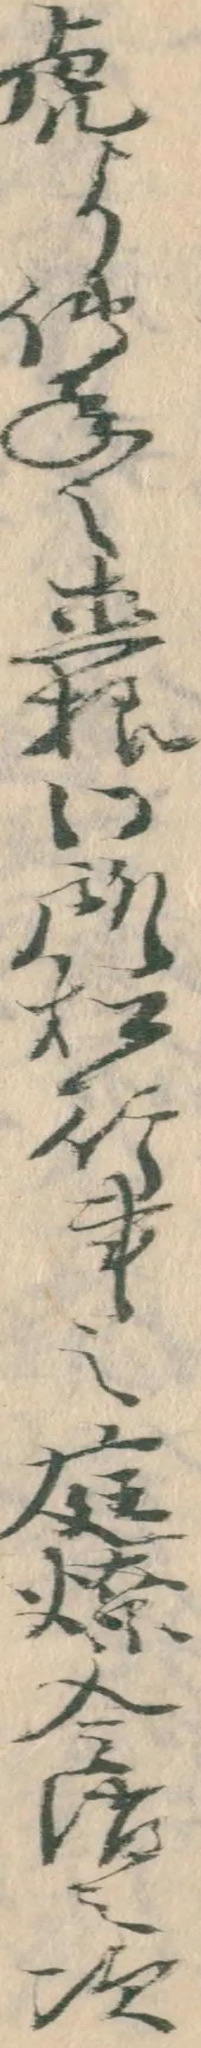虎より傳承候直様同所松行事之庭燎令消之次
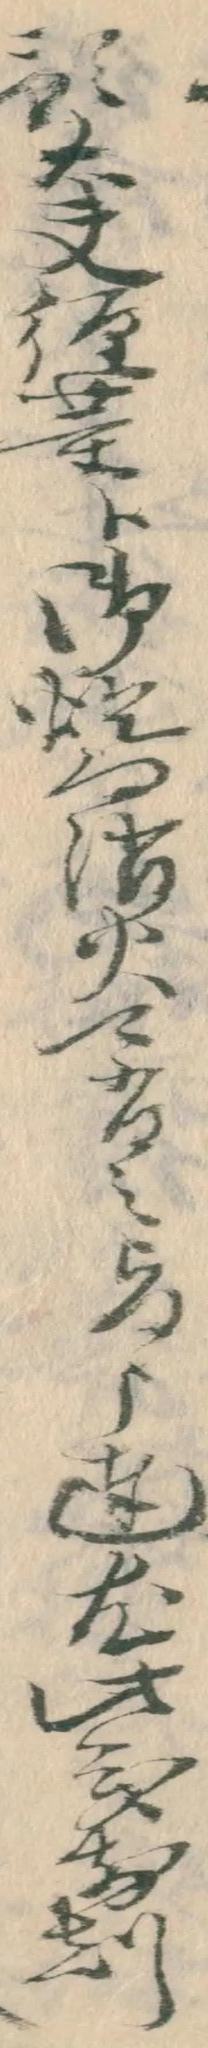預大夫経董ト御燈向消火可有之旨申達尤此義前刻
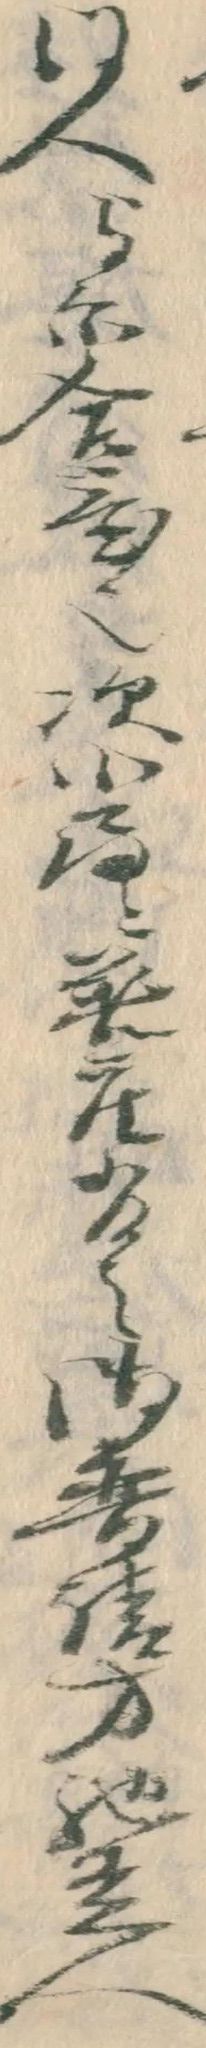同人と示合置也次小局ニ着座有之御普請方馳走人
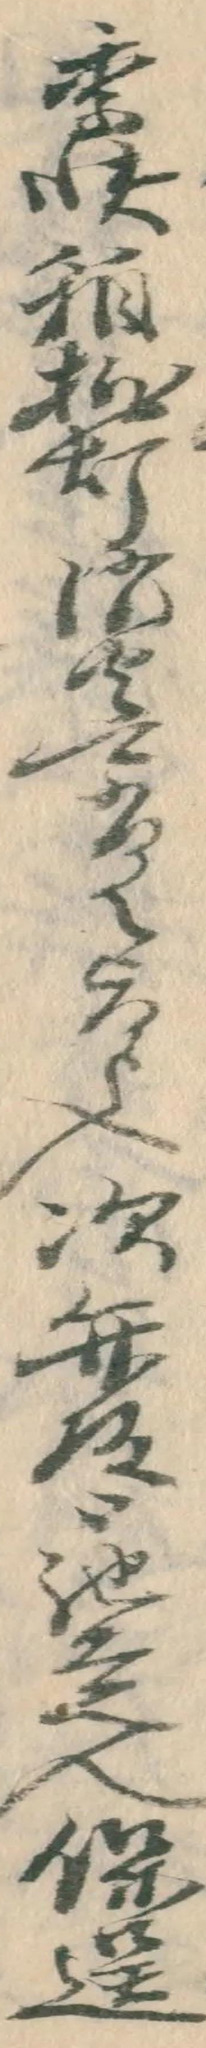季快箱挑灯消火可有之旨被申入次弁殿御馳走人保逞
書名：賀茂社記録. 第67冊
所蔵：国立国会図書館 National Diet Library, JAPAN
